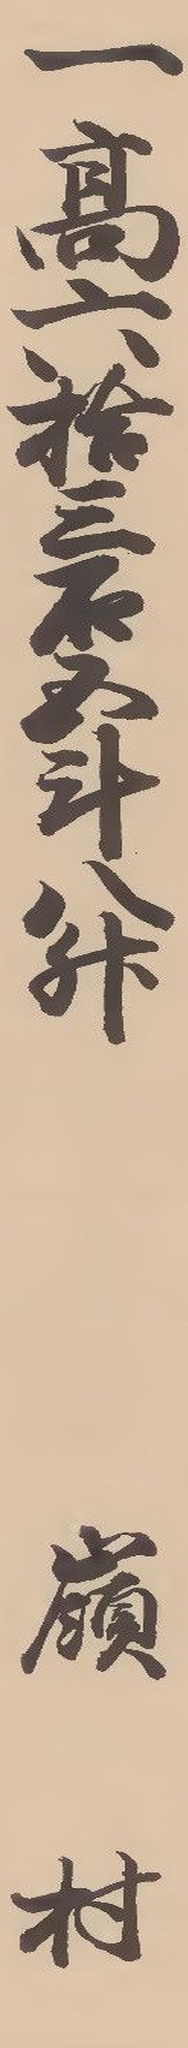一高六拾三石五斗八升嶺村
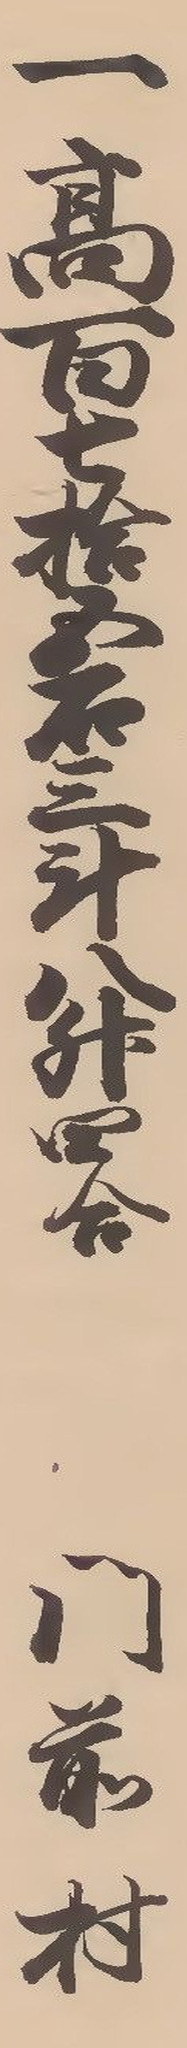一高百七拾五石三斗八升四合門前村
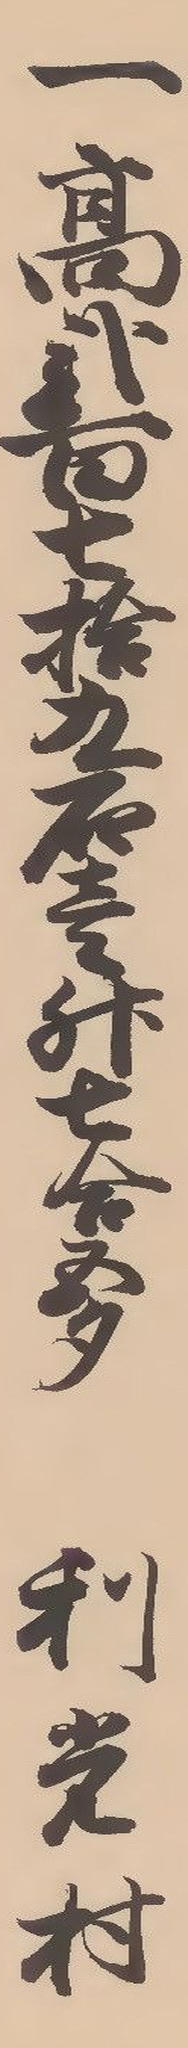一高弐百七拾九石壱升七合五勺利光村
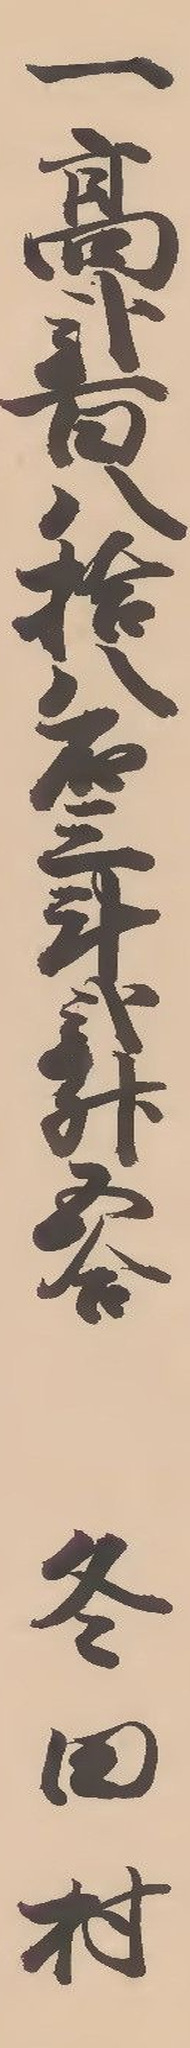一高弐百八拾八石三斗弐升五合冬田村
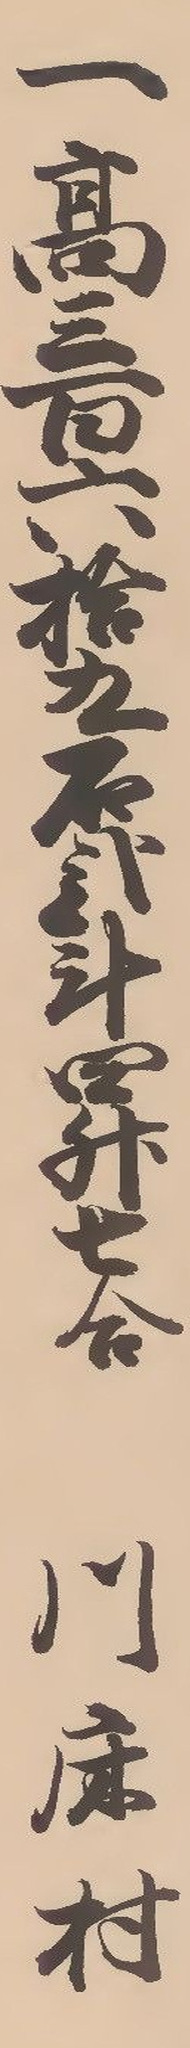一高三百六拾九石弐斗四升七合川床村
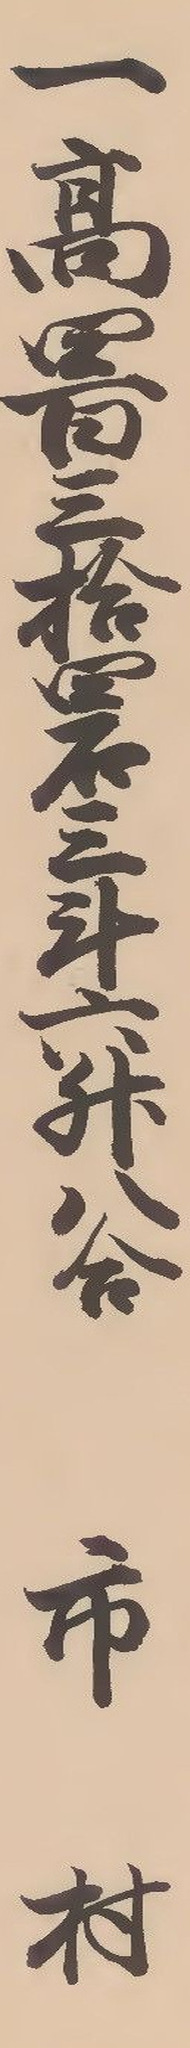一高四百三拾四石三斗六升八合市村
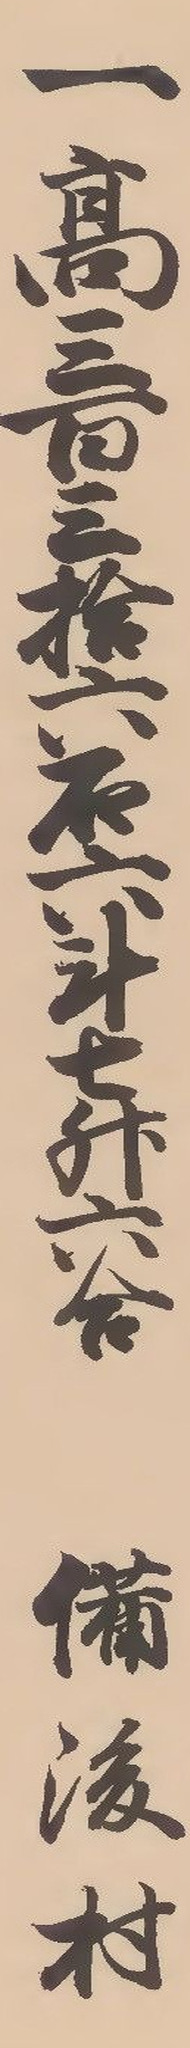一高三百三拾六石六斗七升六合備後村
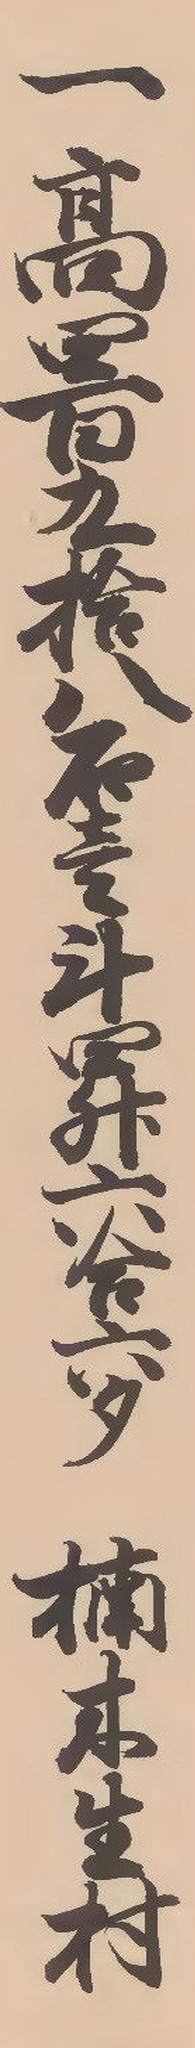一高四百九拾八石壱斗四升六合六勺楠木生村

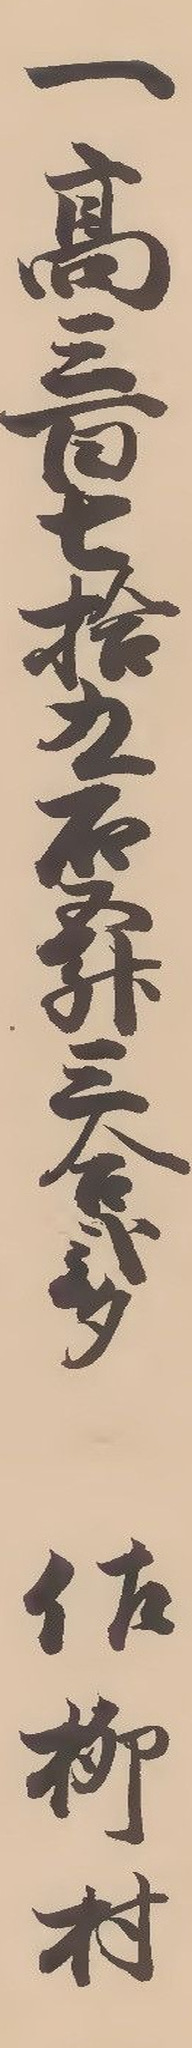一高三百七拾九石五升三合弐勺佐柳村
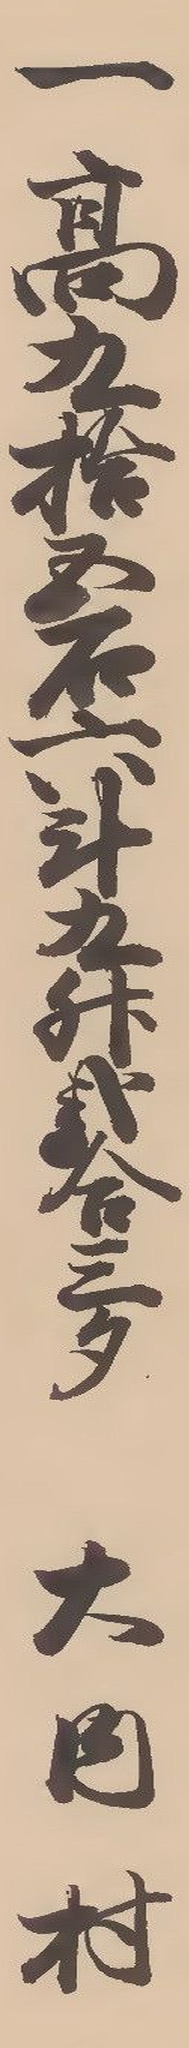一高九拾五石六斗九升弐合三勺大内村
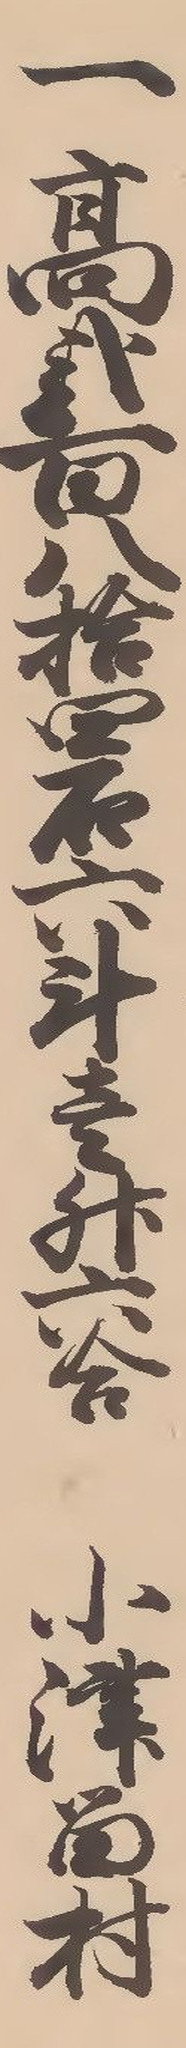一高弐百八拾四石六斗壱升六合小津留村
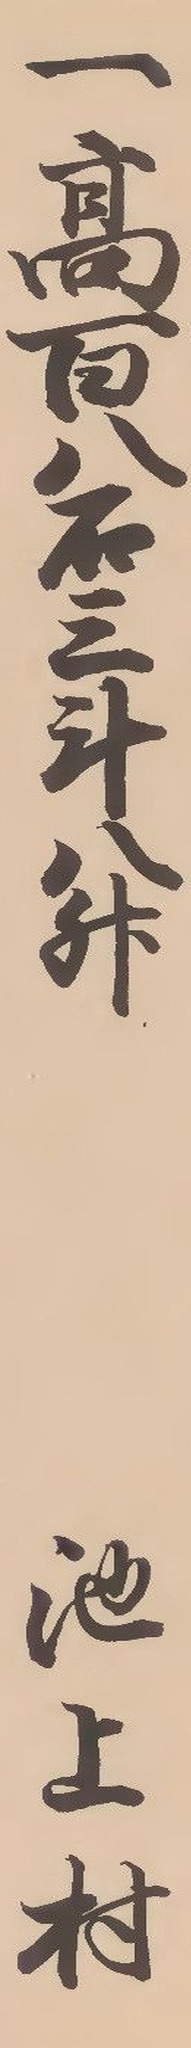一高百八石三斗八升池上村
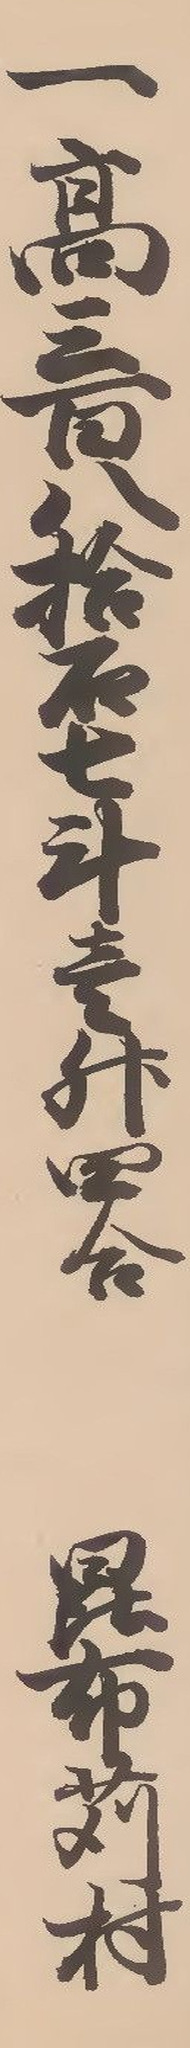一高三百八拾石七斗壱升四合昆布苅村
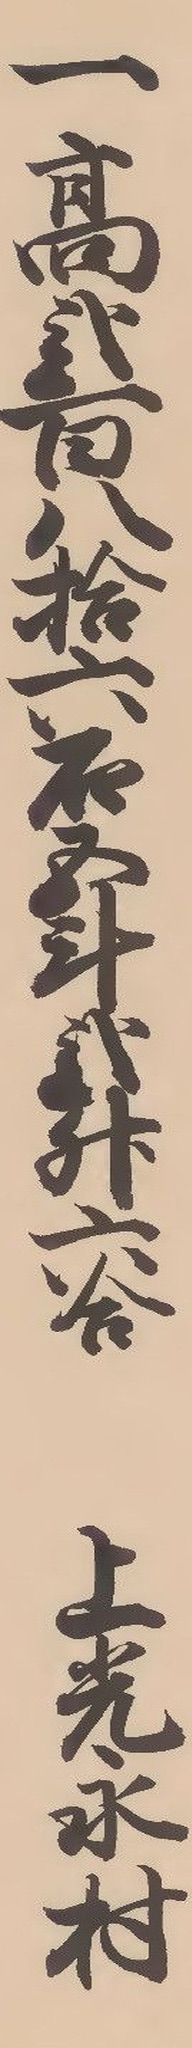一高弐百八拾六石五斗弐升六合上光永村
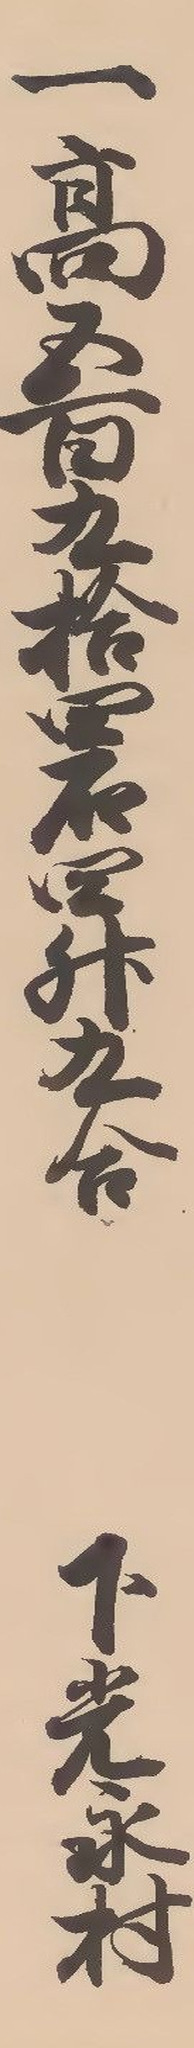一高五百九拾四石四升九合下光永村
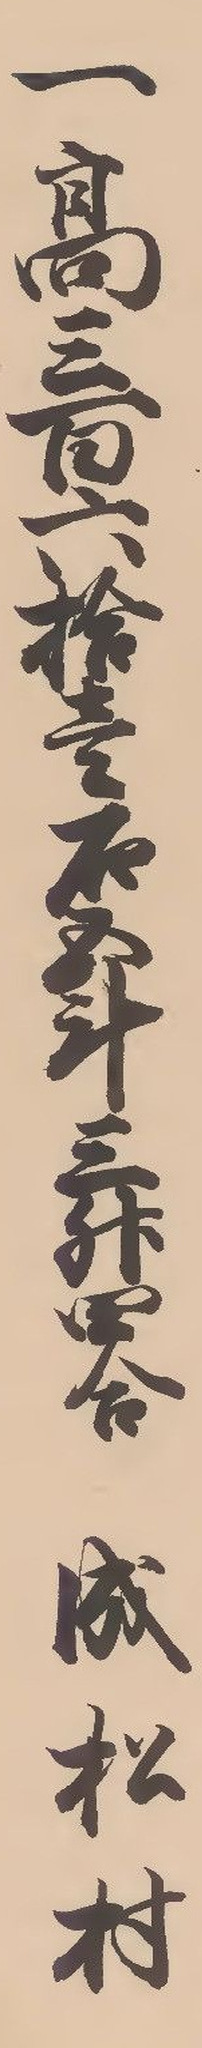一高三百六拾壱石五斗三升四合成松村
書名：豊後国郷帳
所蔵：国立公文書館 National Archives of Japan
